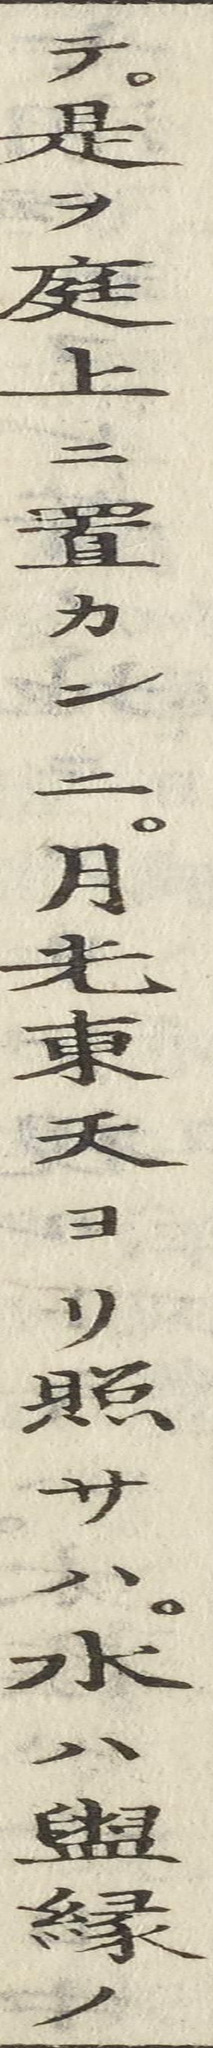テ。是ヲ庭上ニ置カンニ。月光東天ヨリ照サハ。水ハ盥縁ノ
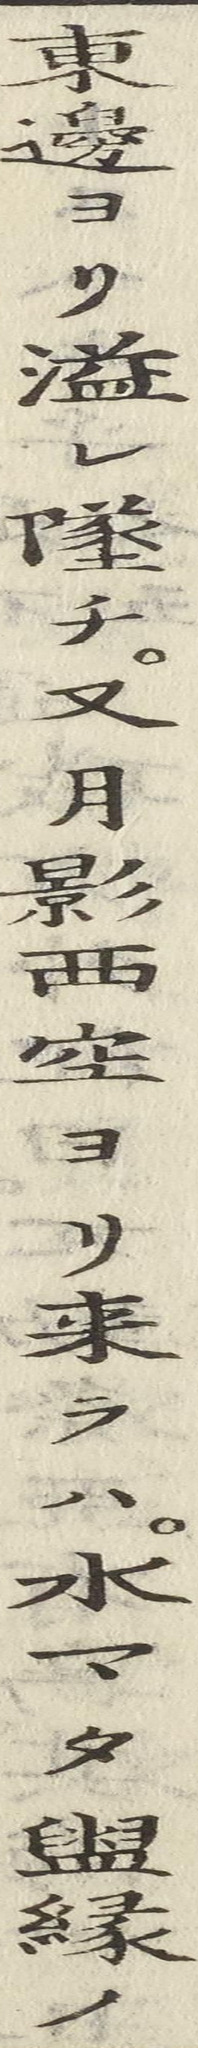東辺ヨリ溢レ墜チ。又月影西空ヨリ来ラハ。水マタ盥縁ノ
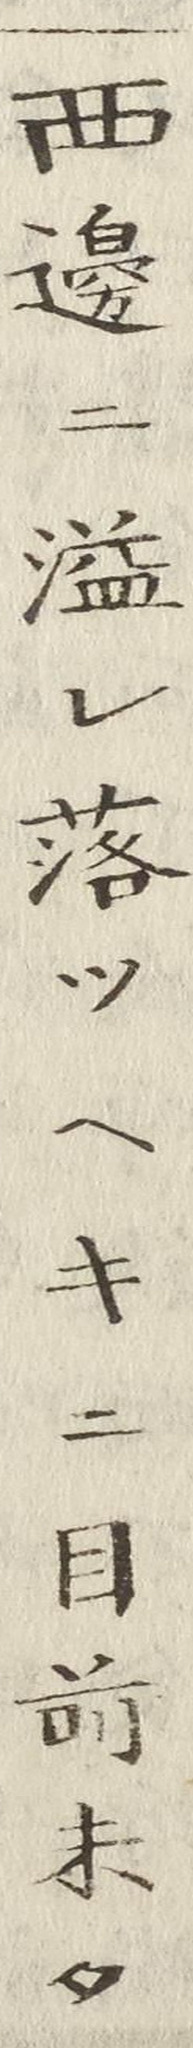西辺ニ溢レ落ツヘキニ目前未タ
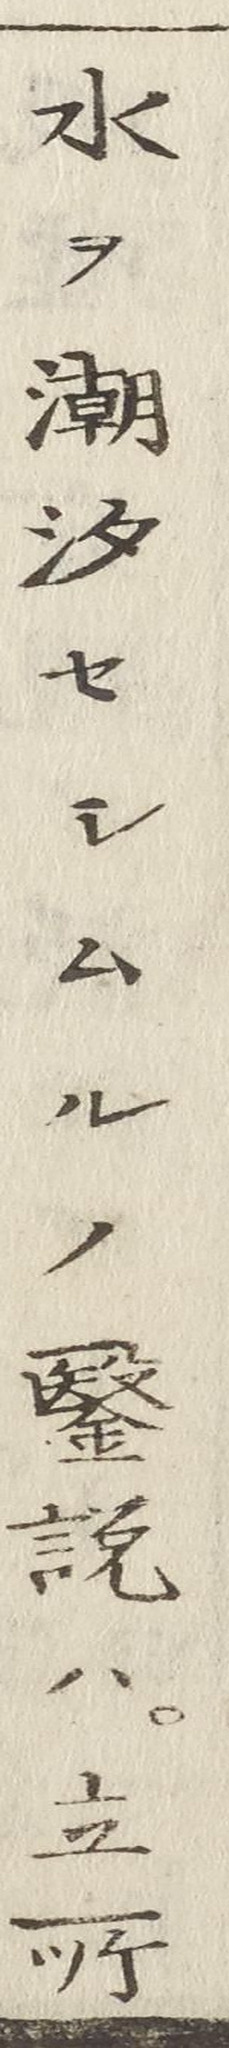水ヲ潮汐セシムルノ鑿説ハ。立所
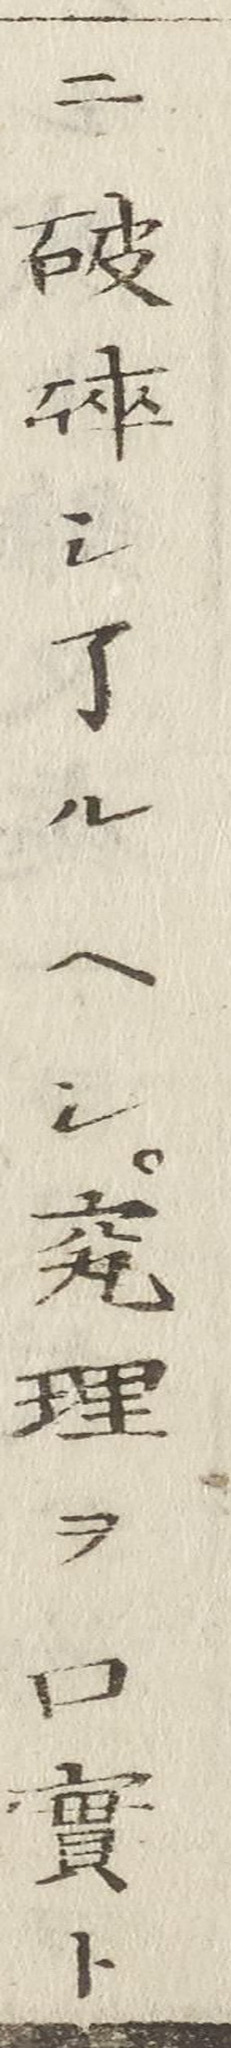ニ破碎シ了ルヘシ。究理ヲ口実ト
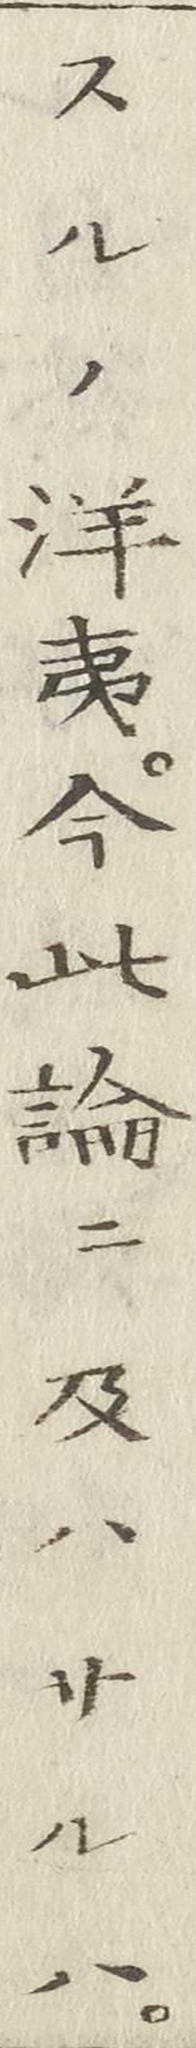スルノ洋夷。今此論ニ及ハサルハ。
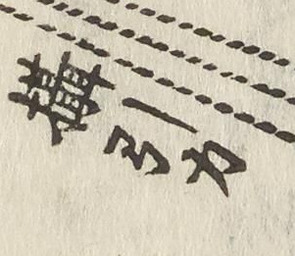摂引力
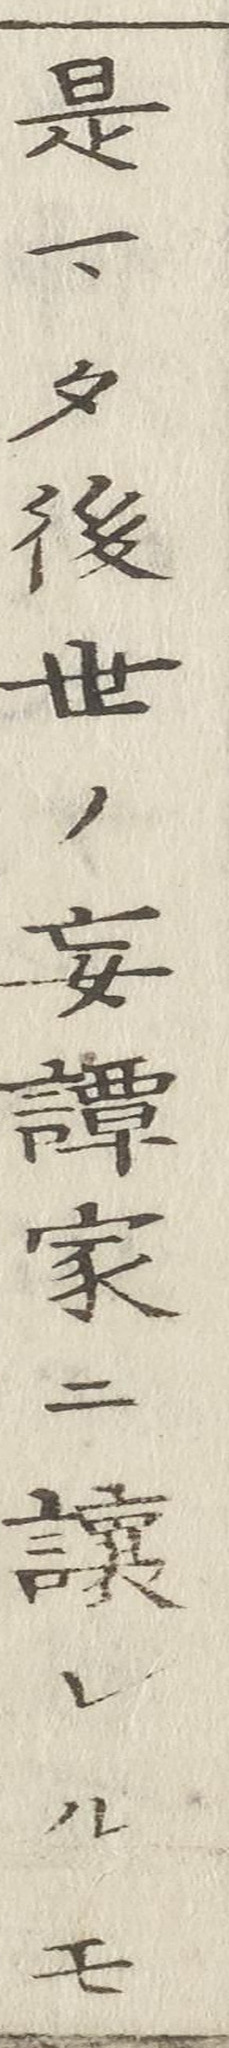是マタ後世ノ妄譚家ニ譲レルモ
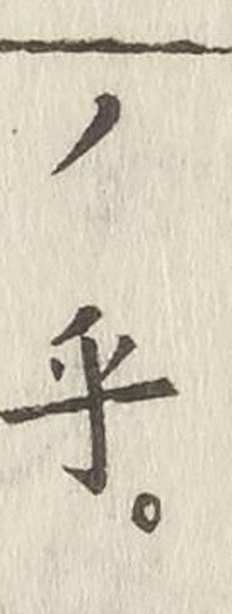ノ乎。
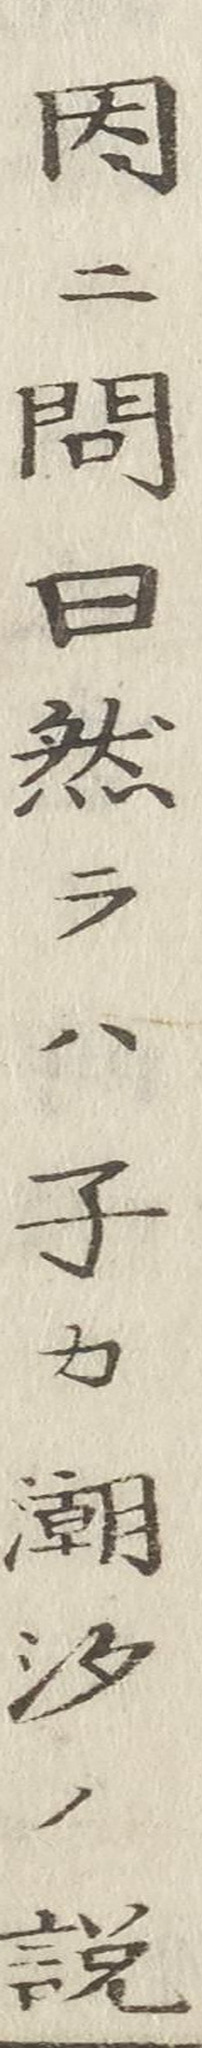因ニ問曰然ラハ子カ潮汐ノ説
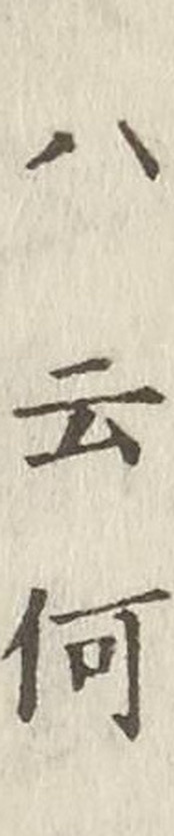ハ云何

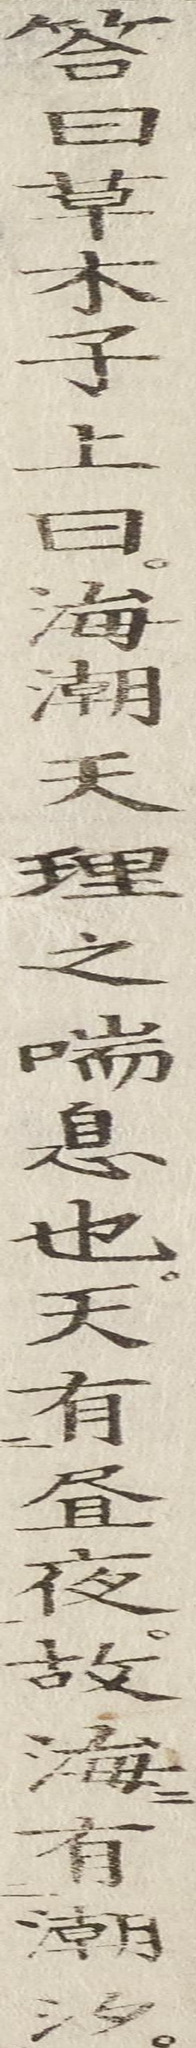答曰草木子上曰。海潮天理之喘息也。天有ニ昼夜。故海有ニ潮汐有。
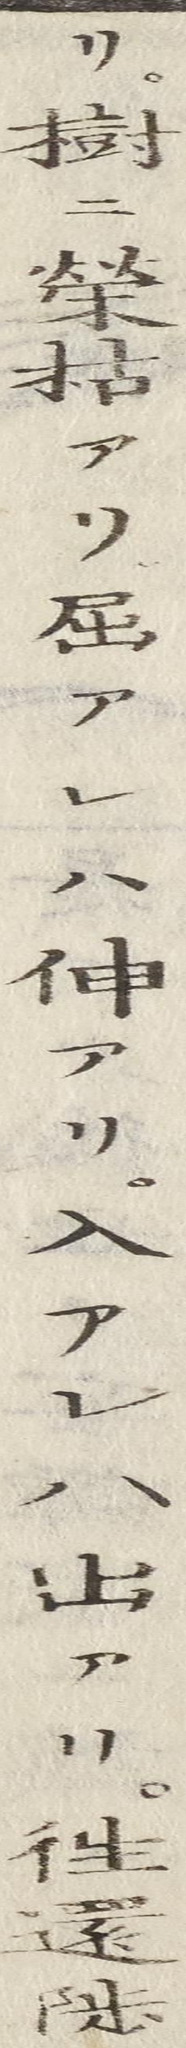リ。樹ニ栄枯アリ。屈アレハ伸アリ。入アレハ出アリ。往還陟
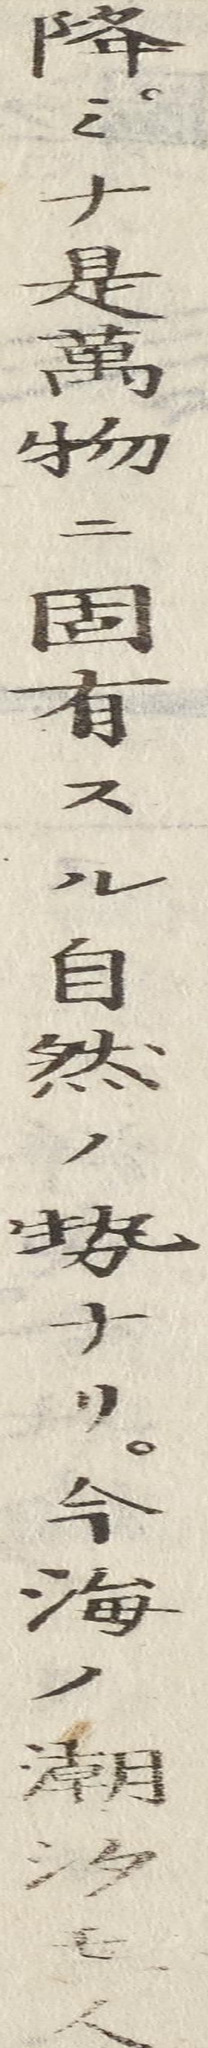降。ミナ是万物ニ固有スル自然ノ勢ナリ。今海ノ潮汐モ人
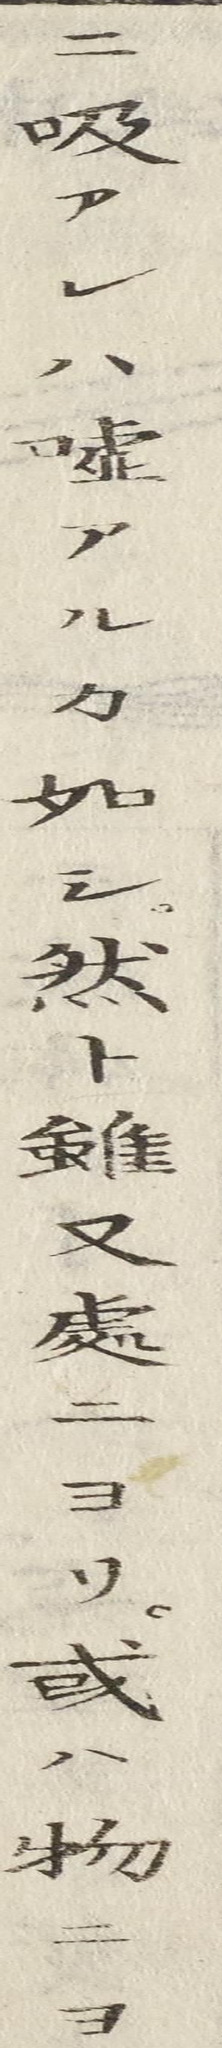ニ吸アレハ嘘アルカ如シ。然ト雖又処ニヨリ。或ハ物ニヨ
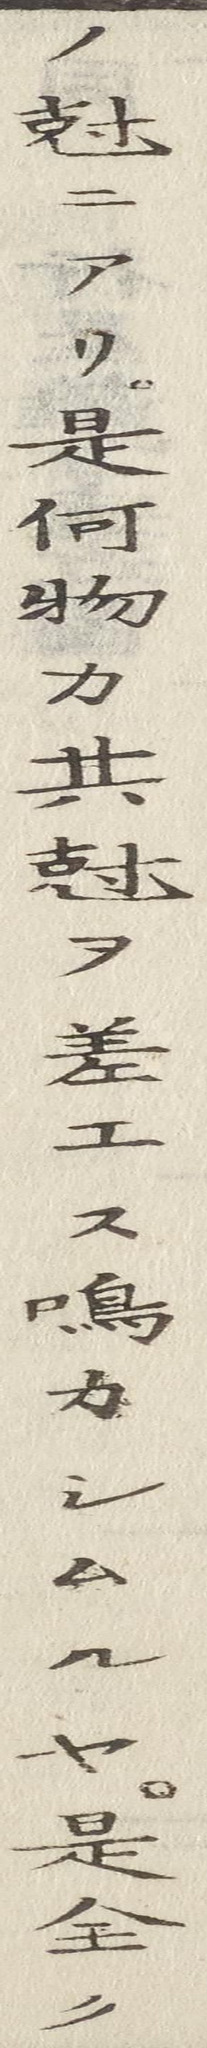ノ尅ニアリ。其何物カ其尅ヲ差エス鳴カシムルヤ。是全ク
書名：護法新論　二編　下
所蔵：東京大学地震研究所図書室 Earthquake Research Institute Library, The University of Tokyo, JAPAN
